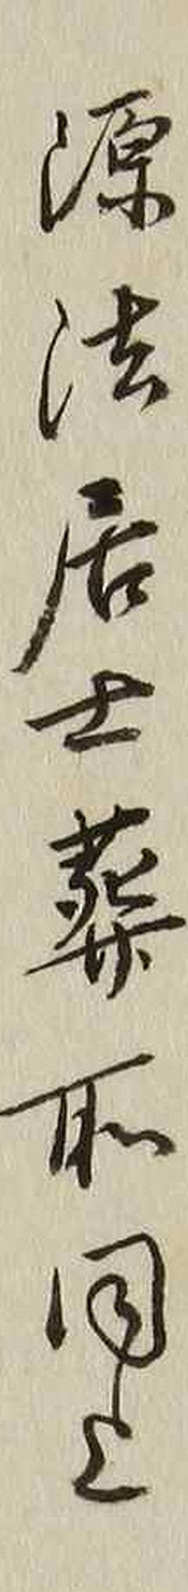源法居士葬所同上
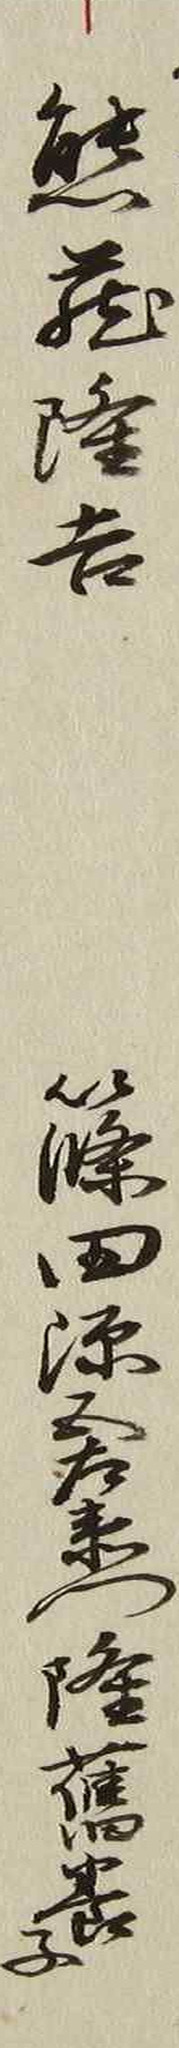態蔵隆吉篠田源五左衛門隆旧養子
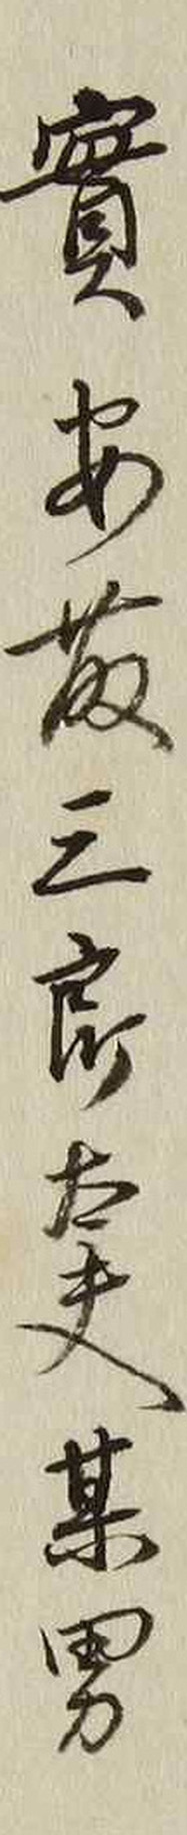実安藤三郎太夫某男
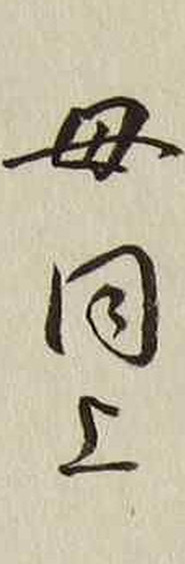母同上
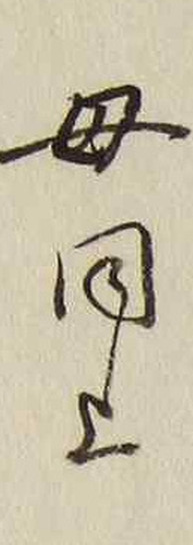母同上

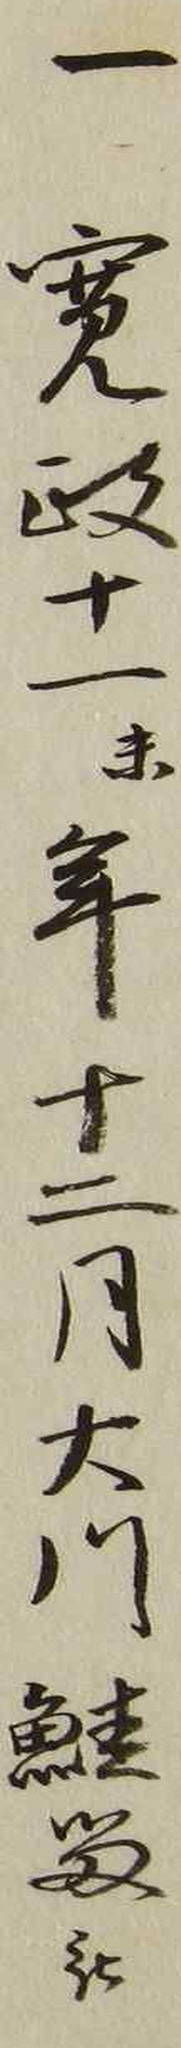一寛政十一未年十二月大川鮭留被
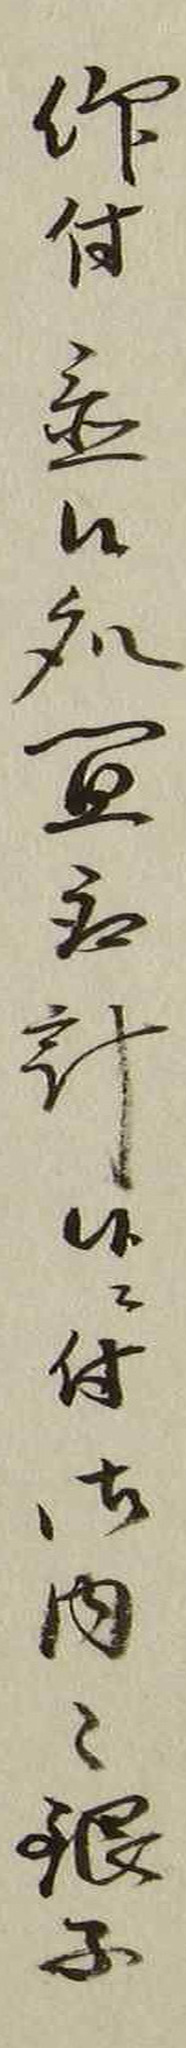仰付置候処宜取計候ニ付御内々銀子
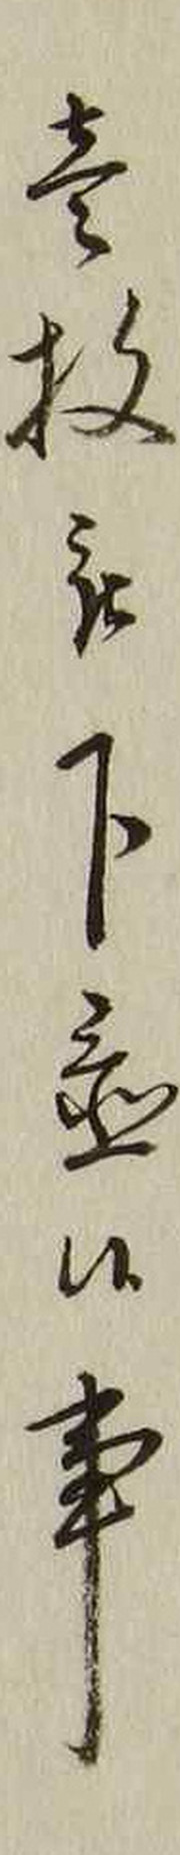壱枚被下置候事
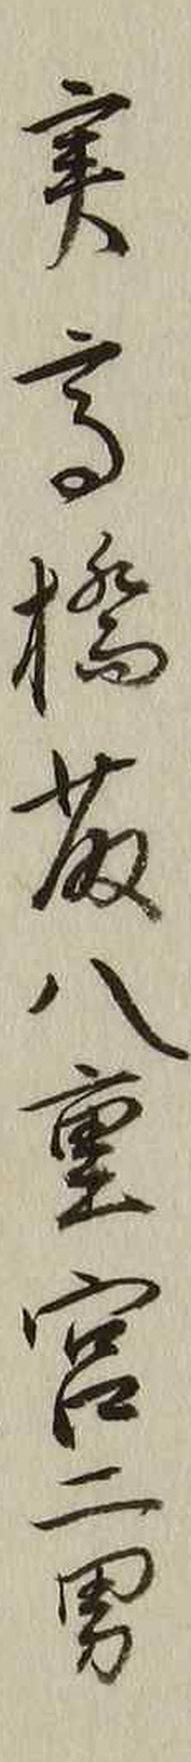実高橋藤八重宮二男
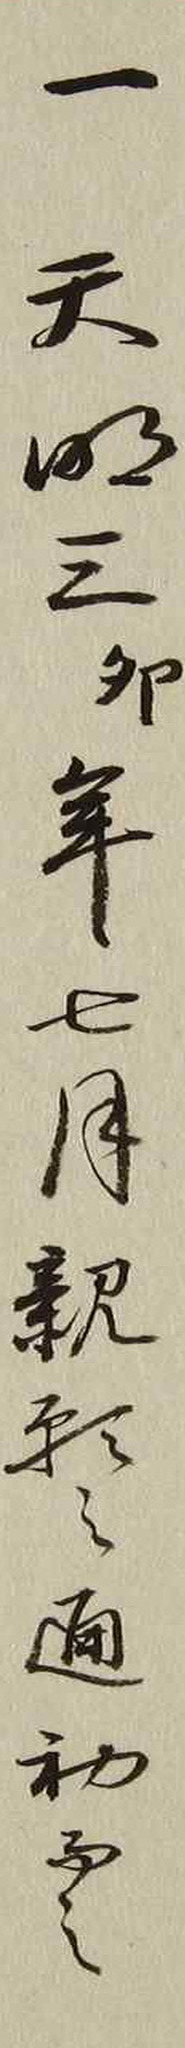一天明三卯年七月親願之通初而之
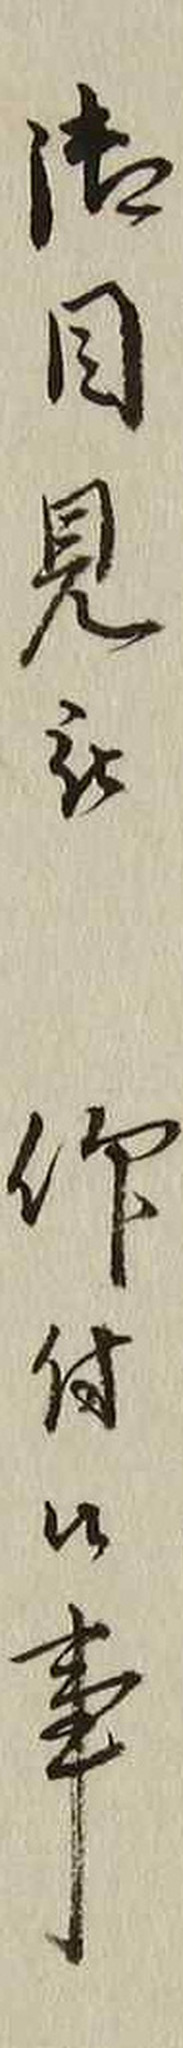御目見被仰付候事
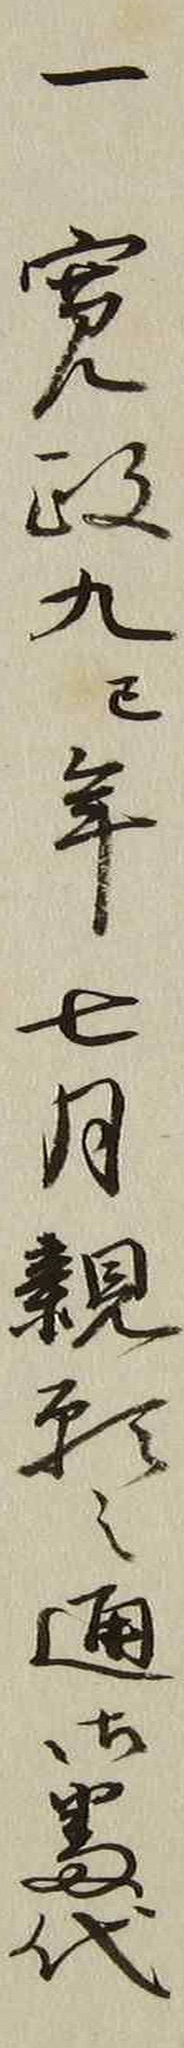一寛政九年巳七月親願之通御番代
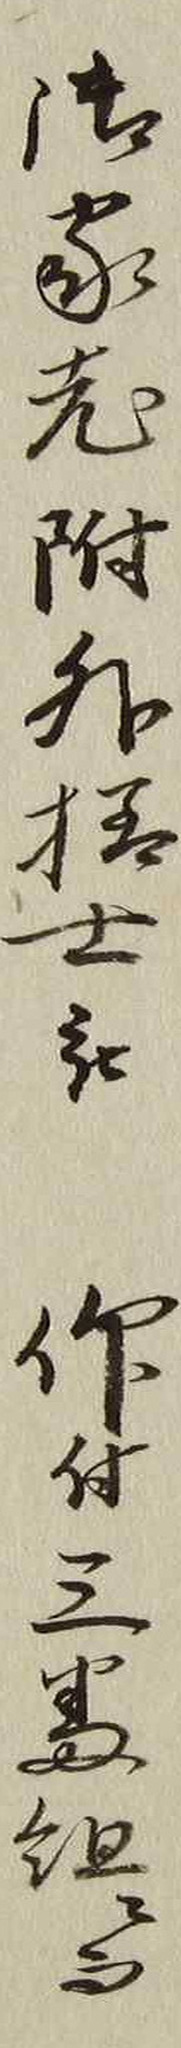御家老附外様士被仰付三番組ニ而
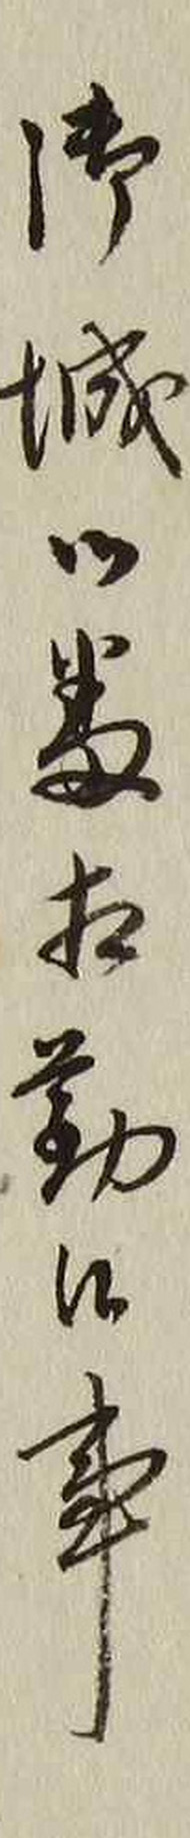御城御番相勤候事
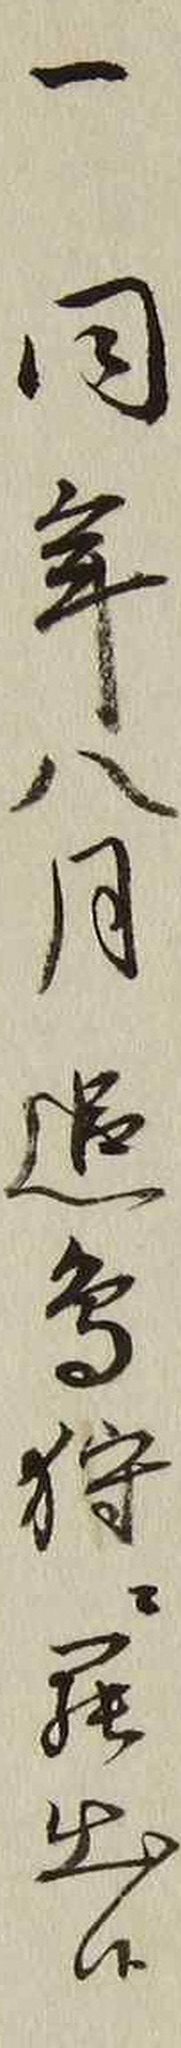一同年八月追鳥狩ニ罷出候
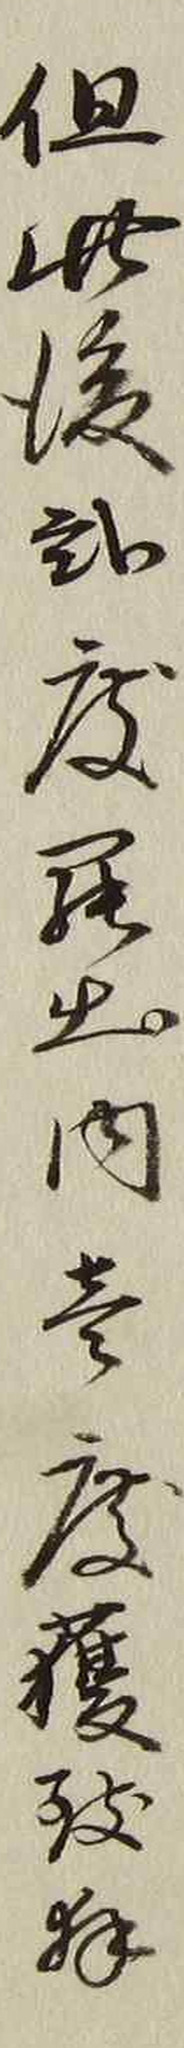但此後弐度罷出内壱度獲致拝
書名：諸士系譜　巻之149　そ之部2
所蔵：会津若松市立会津図書館
